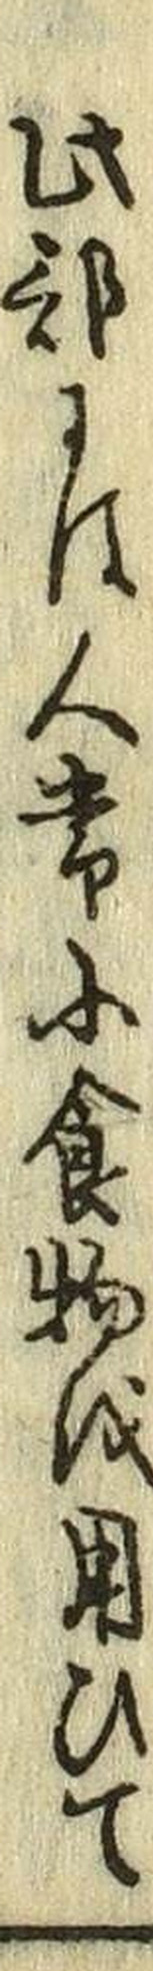此部には人常に食物を用ひて
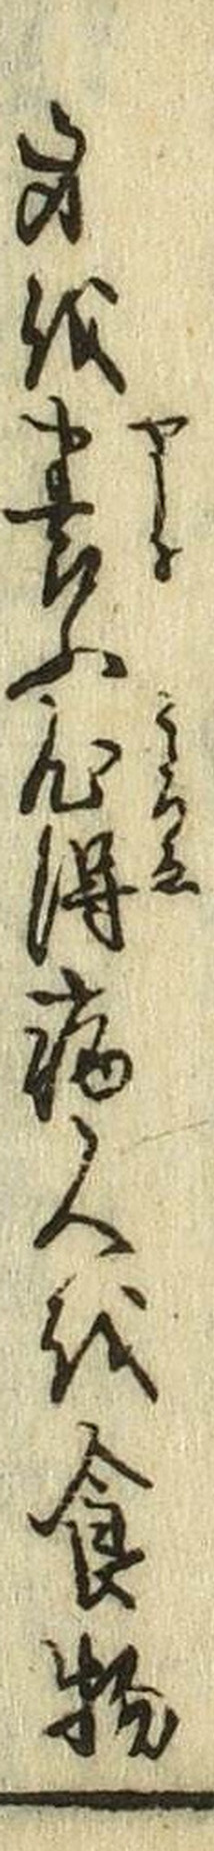身を養ふ心得病人を食物
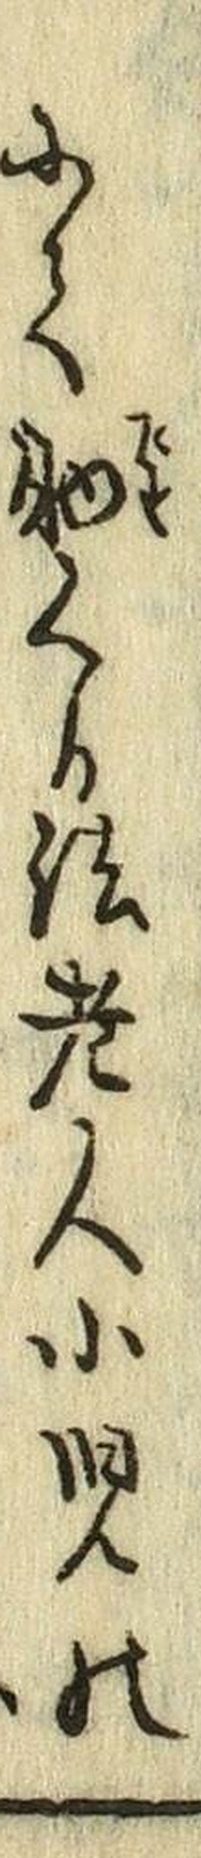にて助くる法老人小児の
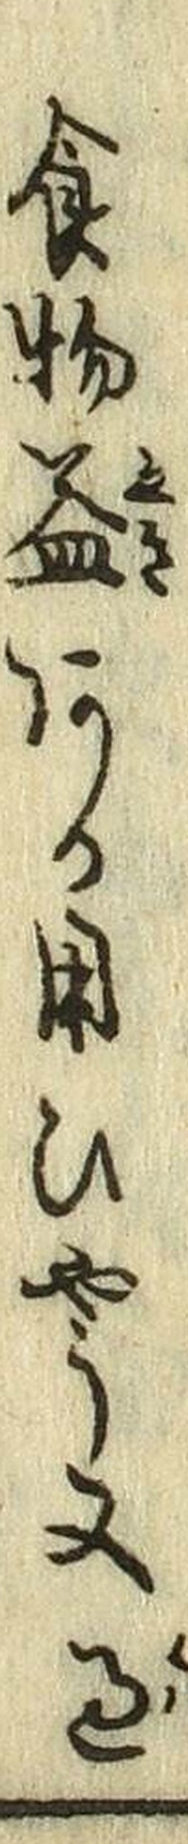食物益ある用ひやう又過
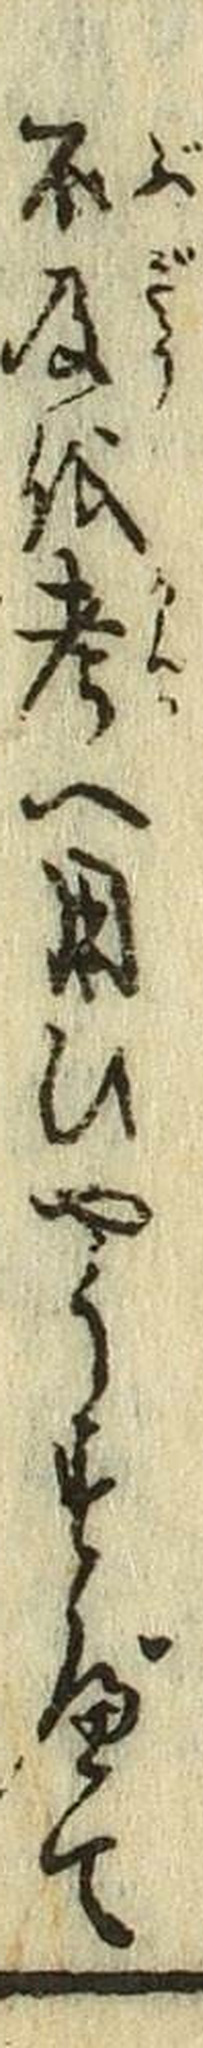不及を考へ用ひやうすべて
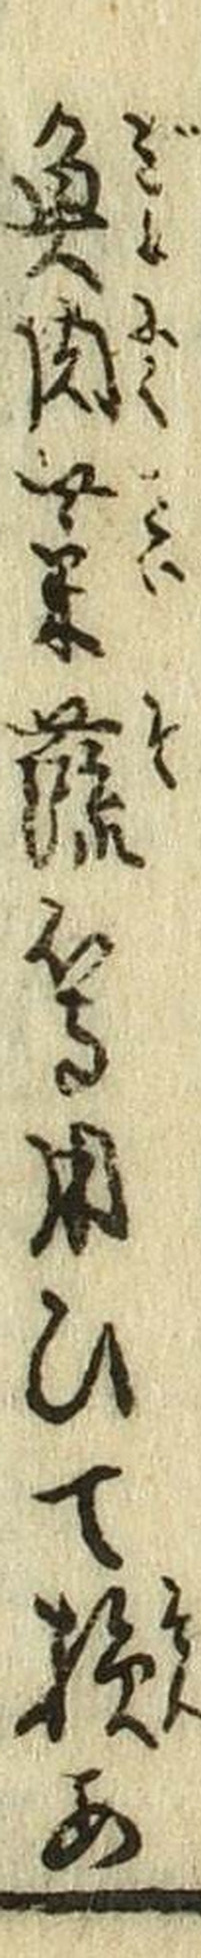魚肉菜蔬等用ひて損あ
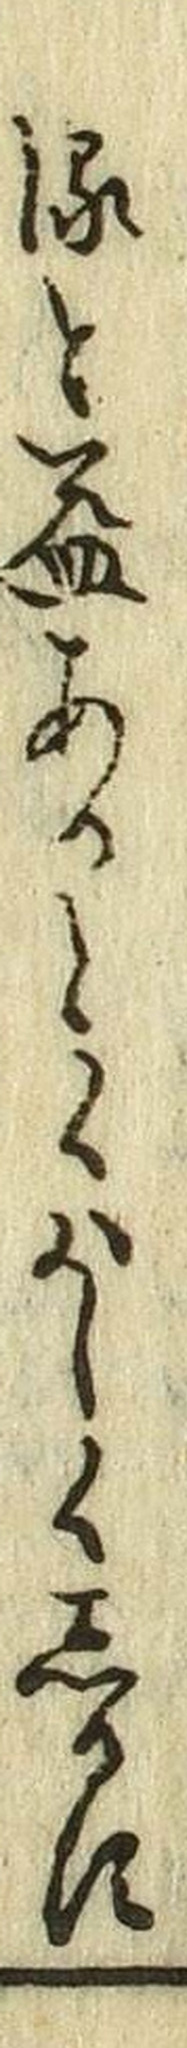ると益あるとくはしくしるす
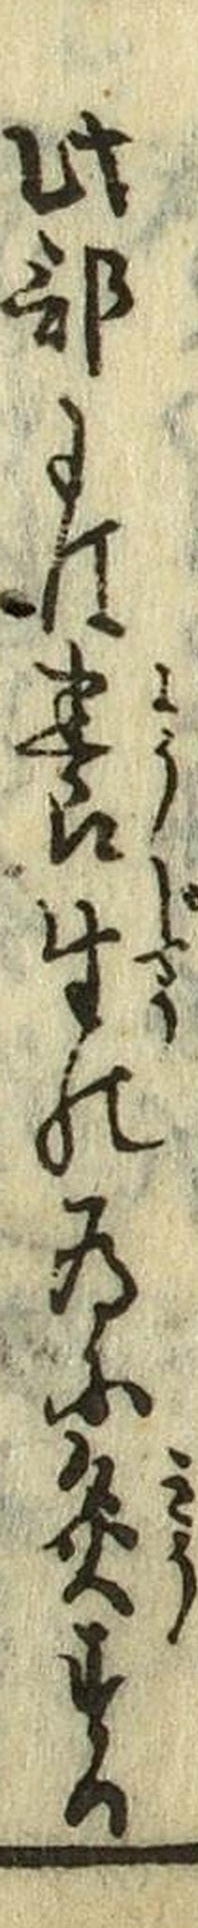此部には養生の為に灸する
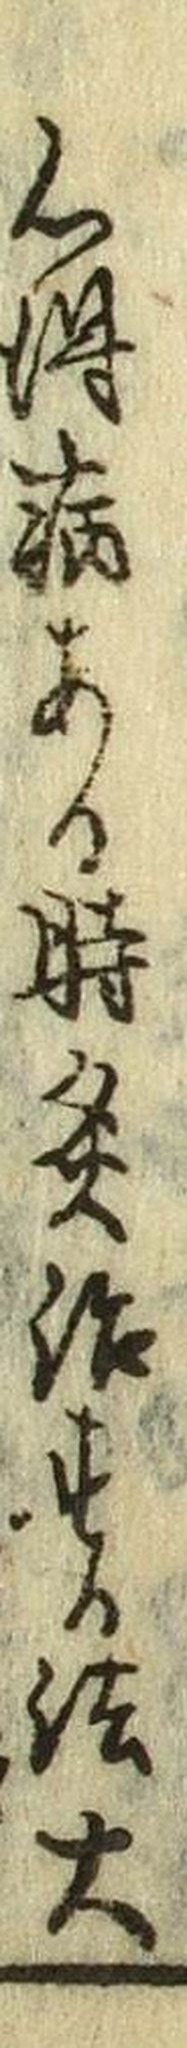心得病ある時灸治する法大
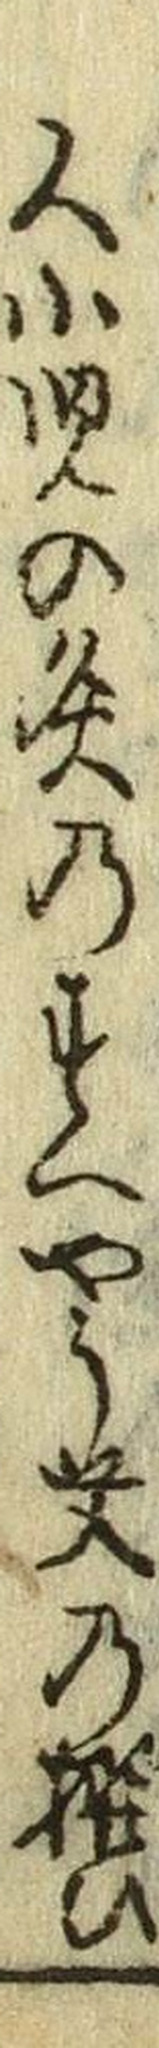人小児の灸のすへやう艾の撰ひ
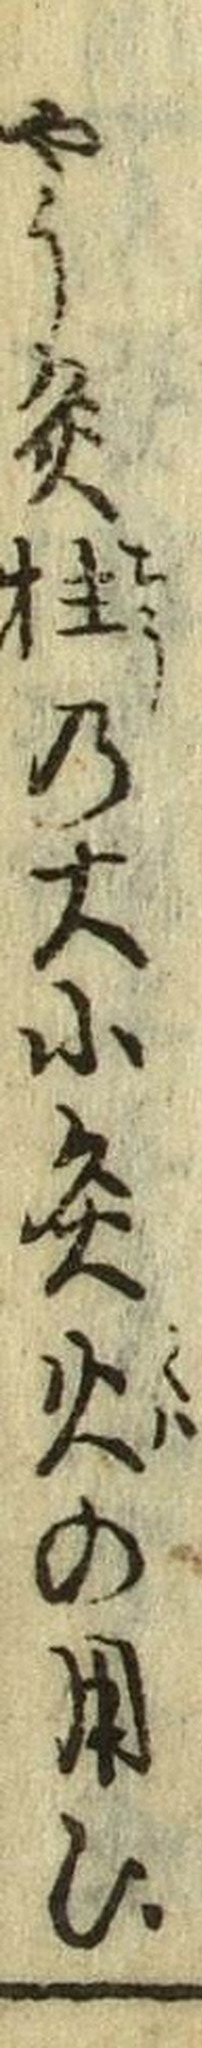やう灸柱の大小灸火の用ひ

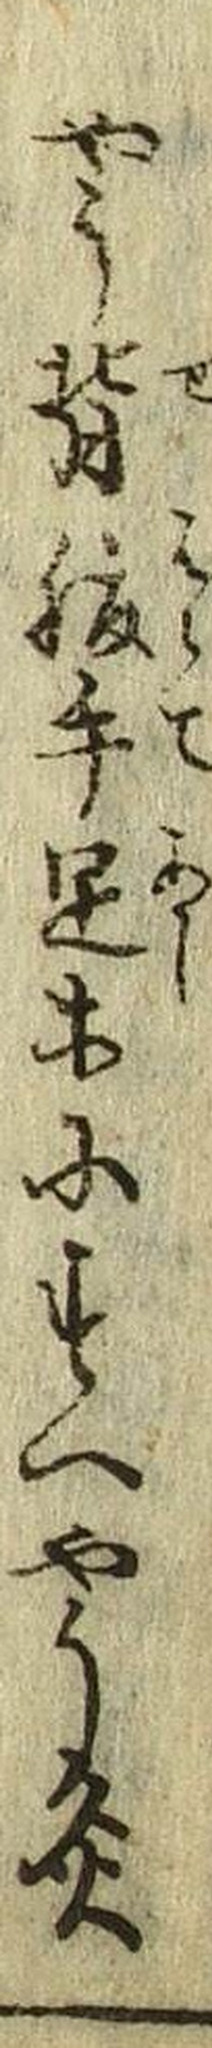やう背腹手足等にすへやう灸
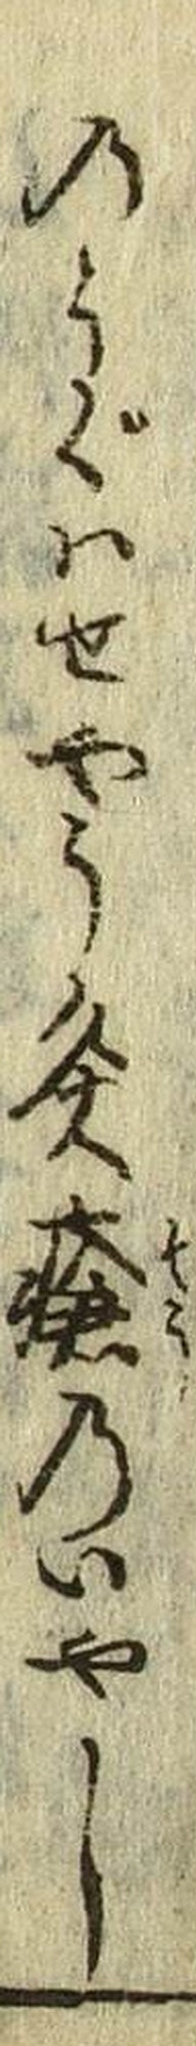のそぐはせやう灸瘡のいやし
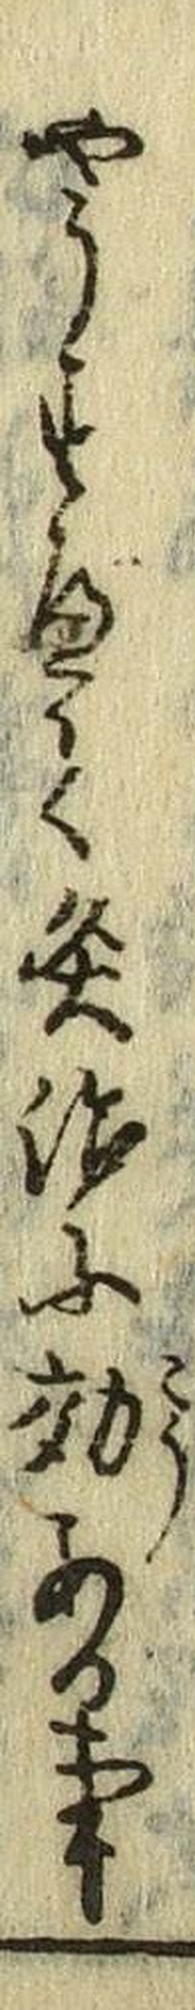やうすべて灸治に効ある事
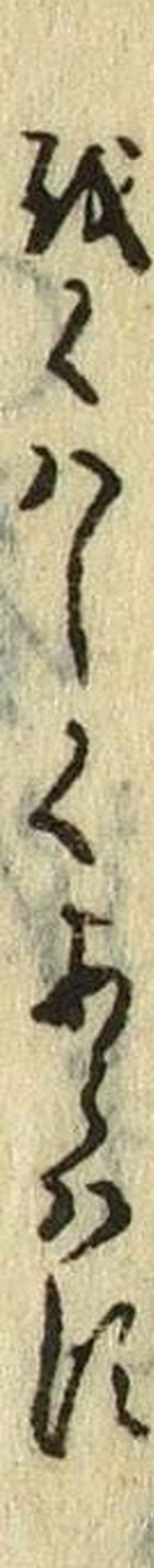をくはしくあらはす
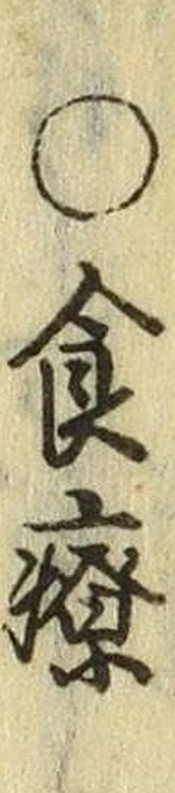○食療
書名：居家養生記
